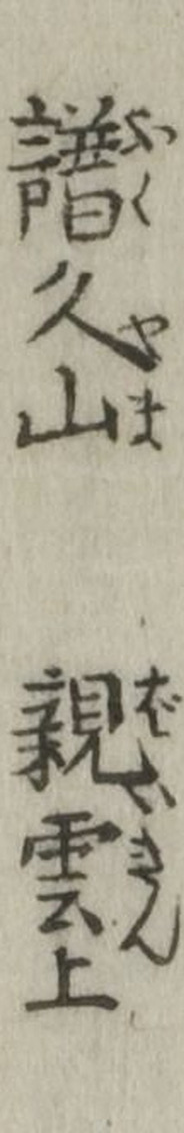譜久山親雲上
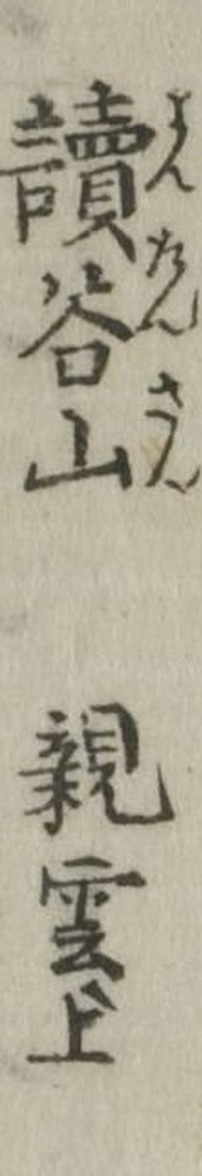讀谷山親雲上
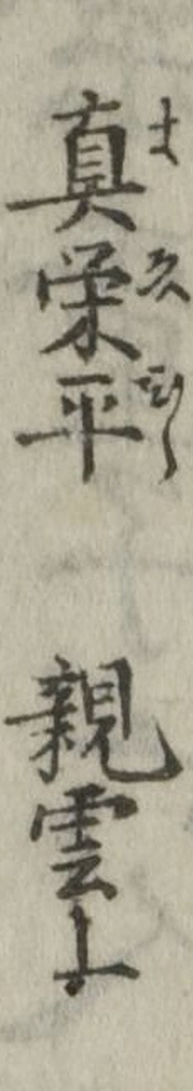真栄平親雲上
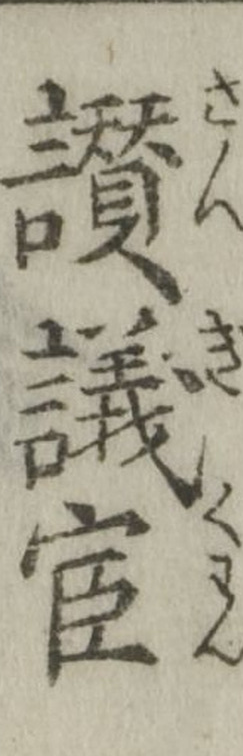讃議宦
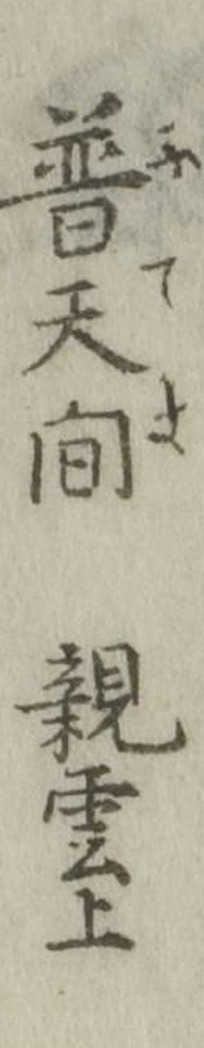普天間親雲上
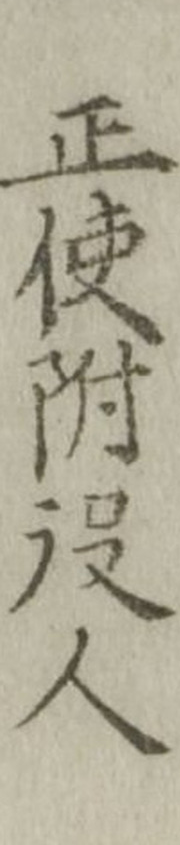正使附従人
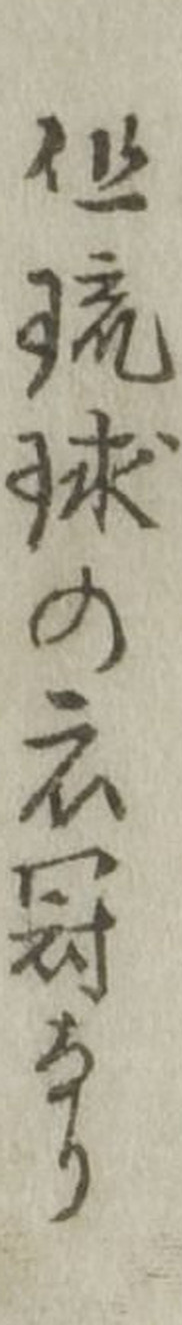但琉球の衣冠なり

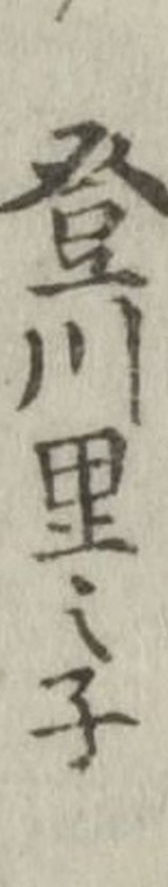登川里之子
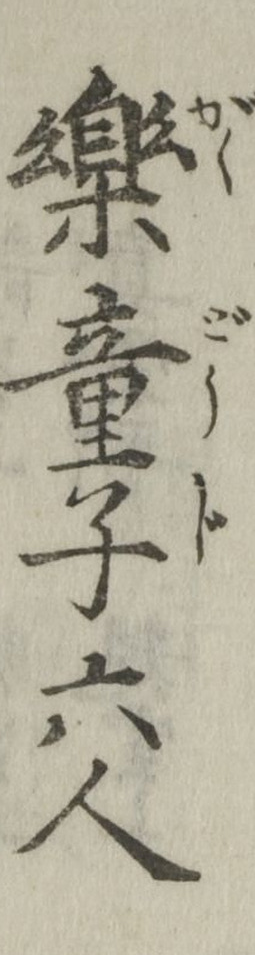樂童子六人
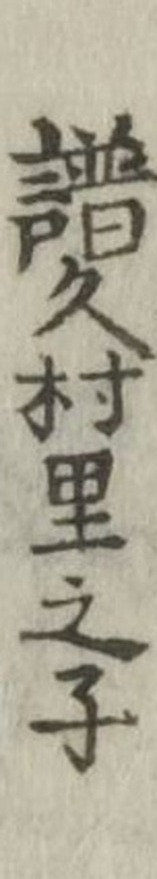譜久村里之子
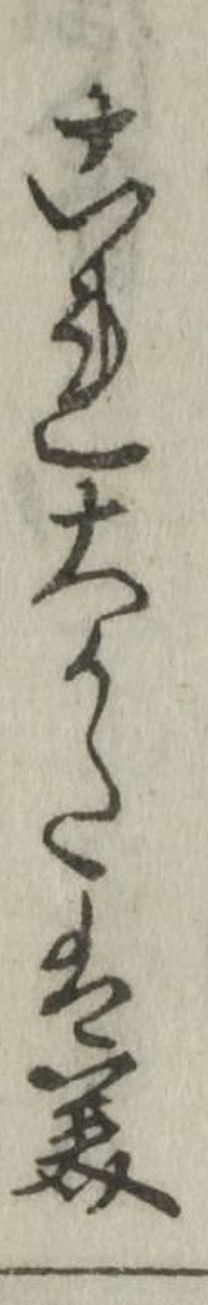これ大かたは美
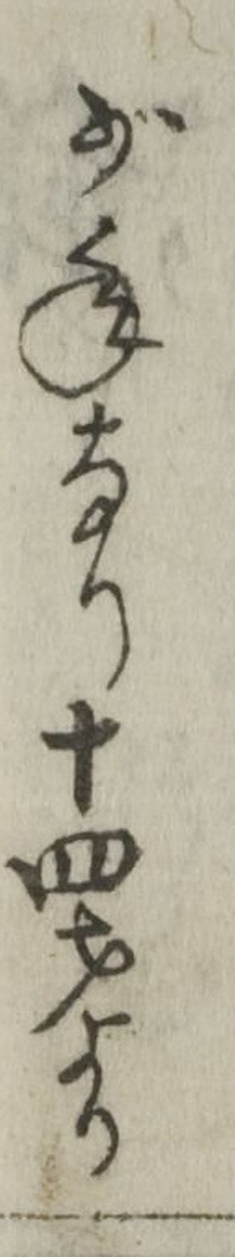少年なり十四才より
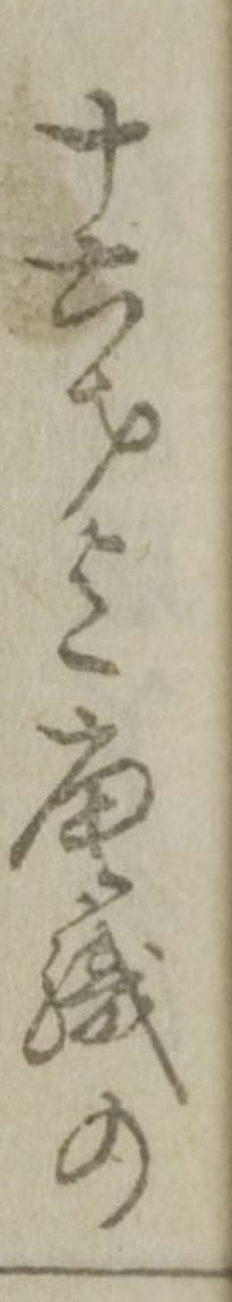十六才は唐織の
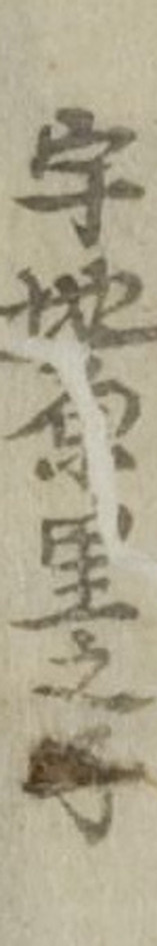宇地原里之子
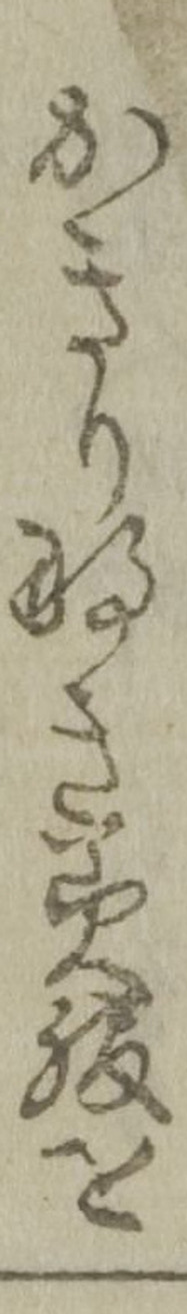かきりなき美服を
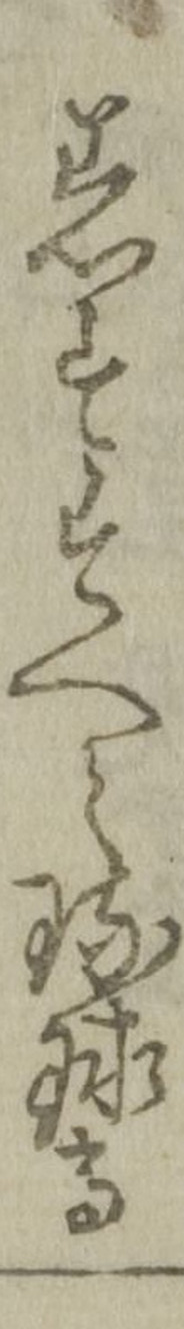着すすへて琉球高
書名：琉球人行列記 天保3年
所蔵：University of the Ryukyus Library
